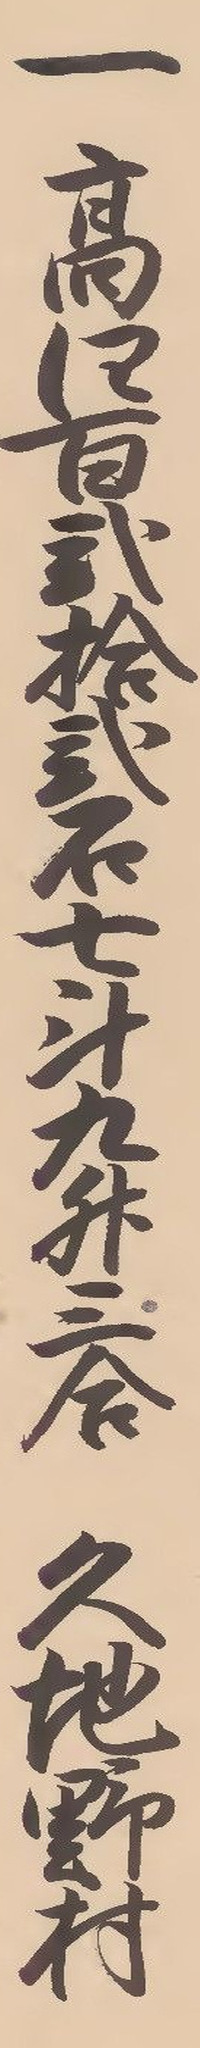一高四百弐拾弐石七斗九升三合久地野村

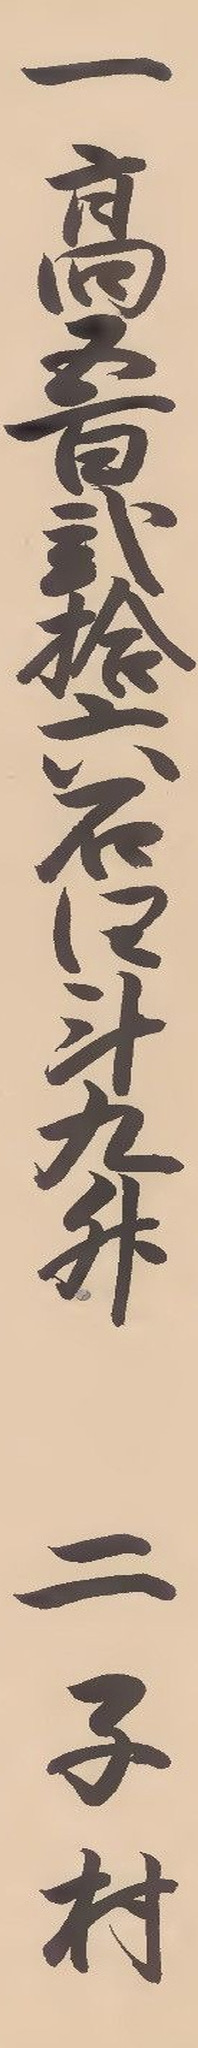一高五百弐拾六石四斗九升二子村
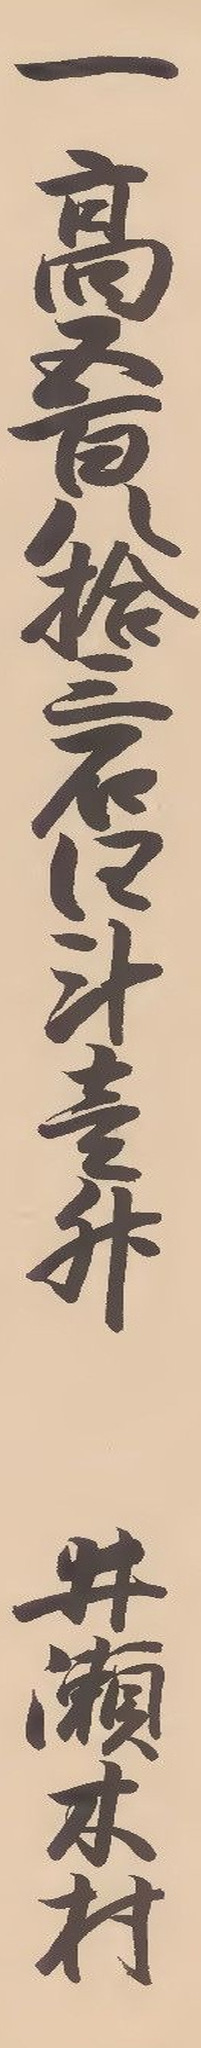一高五百八拾三石四斗壱升井瀬木村
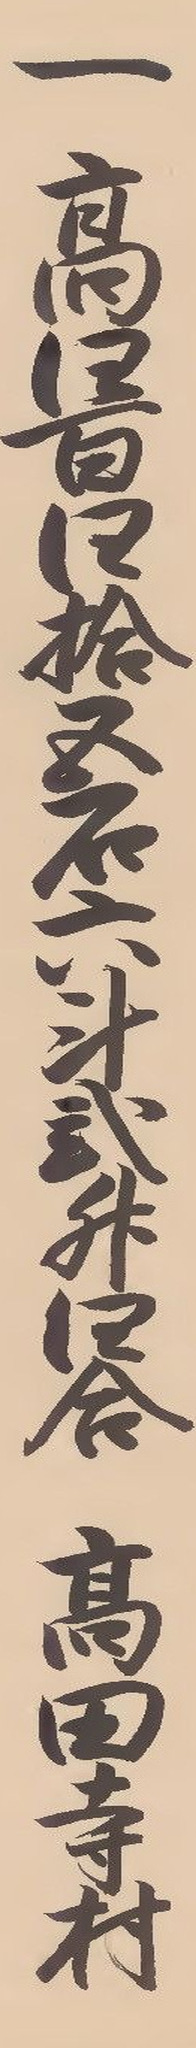一高四百四拾五石六斗弐升四合高田寺村
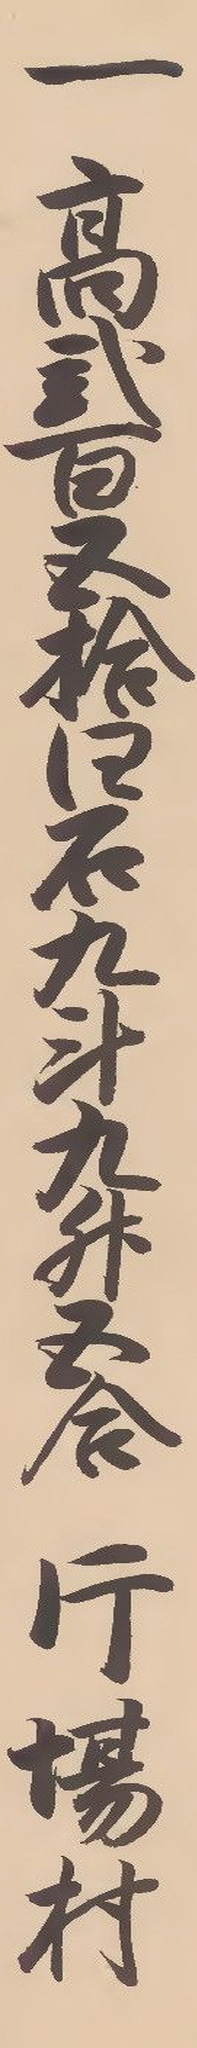一高弐百五拾四石九斗九升五合片場村
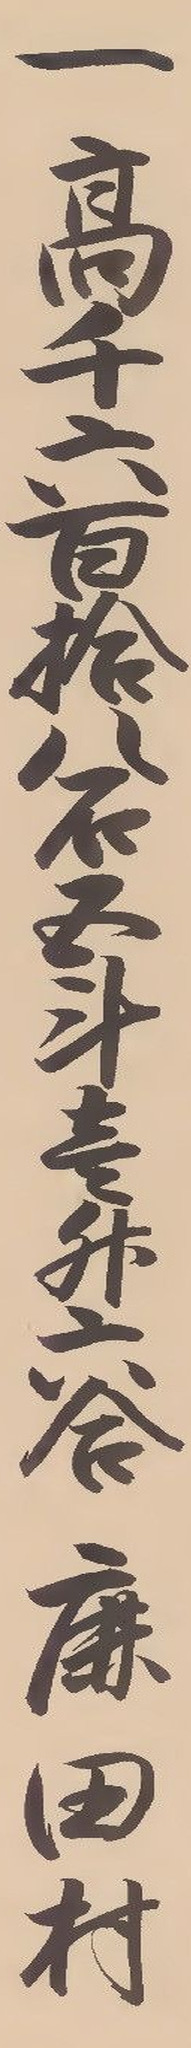一高千六百拾八石五斗壱升六合鹿田村
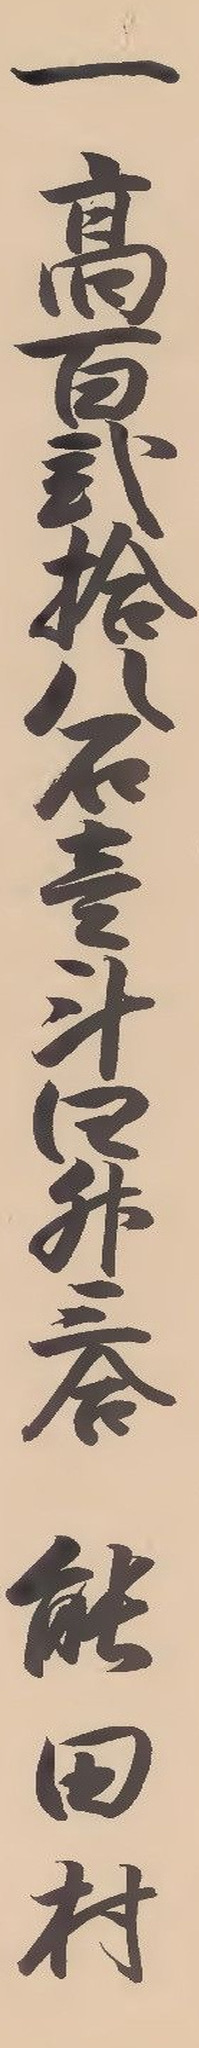一高百弐拾八石壱斗四升三合能田村
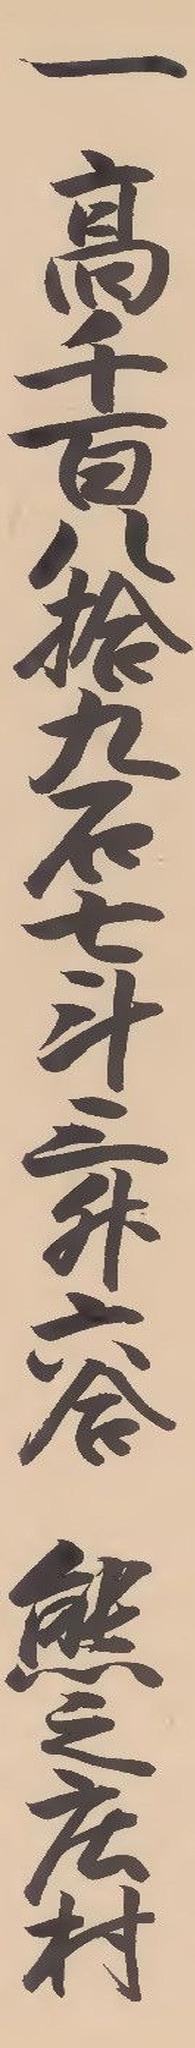一高千百八拾九石七斗三升六合熊之庄村
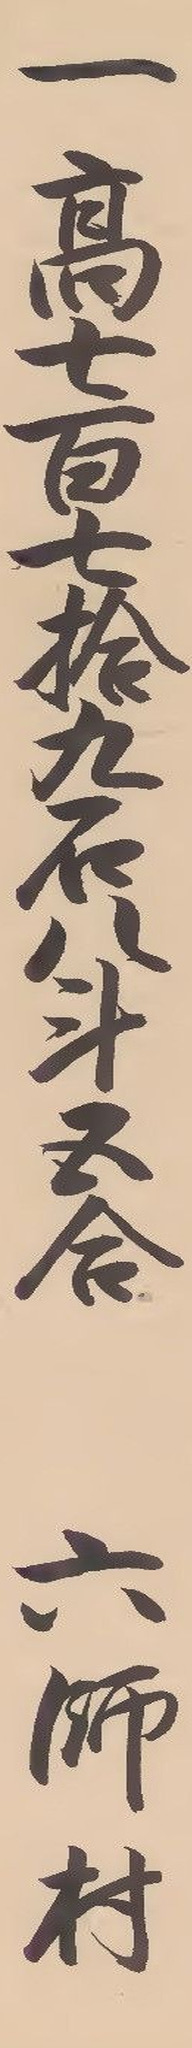一高七百七拾九石八斗五合六師村

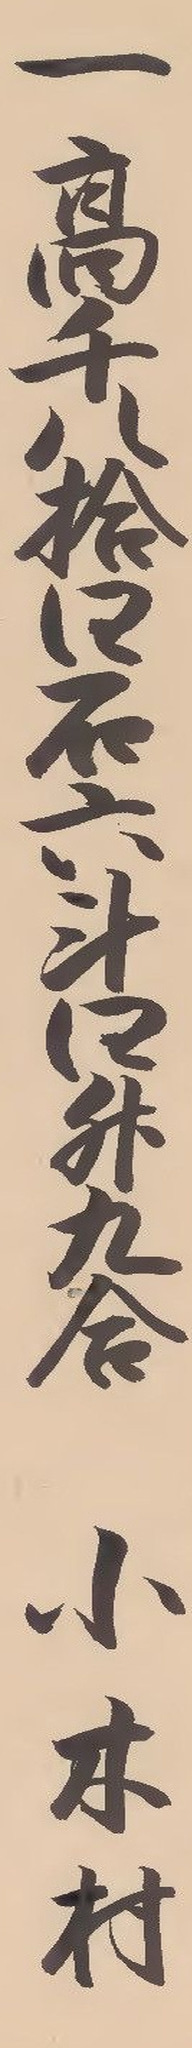一高千八拾四石六斗四升九合小木村
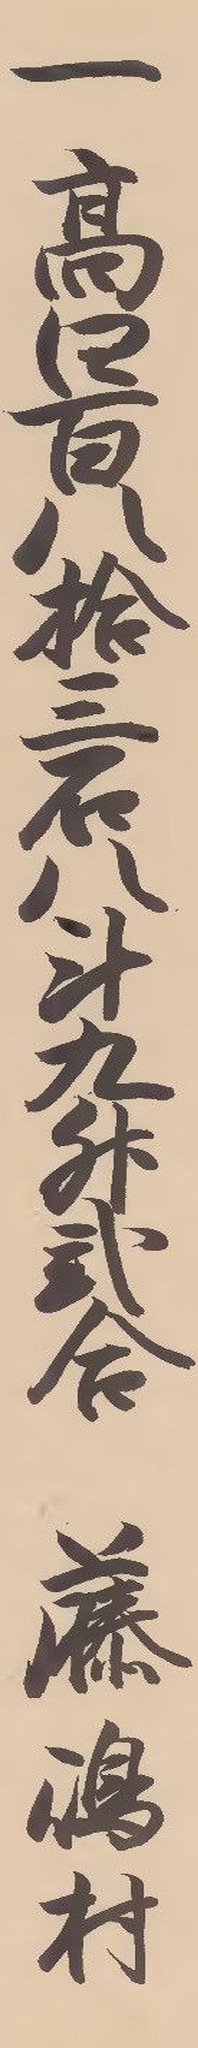一高四百八拾三石八斗九升弐合藤島村
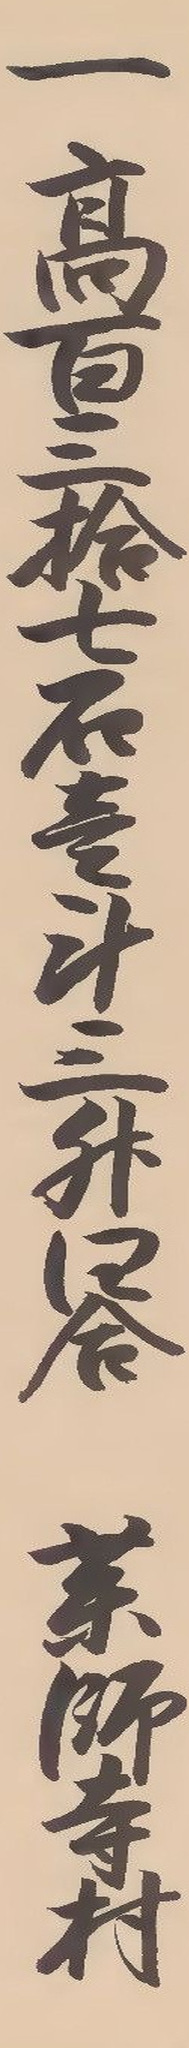一高百三拾七石壱斗三升四合薬師寺村
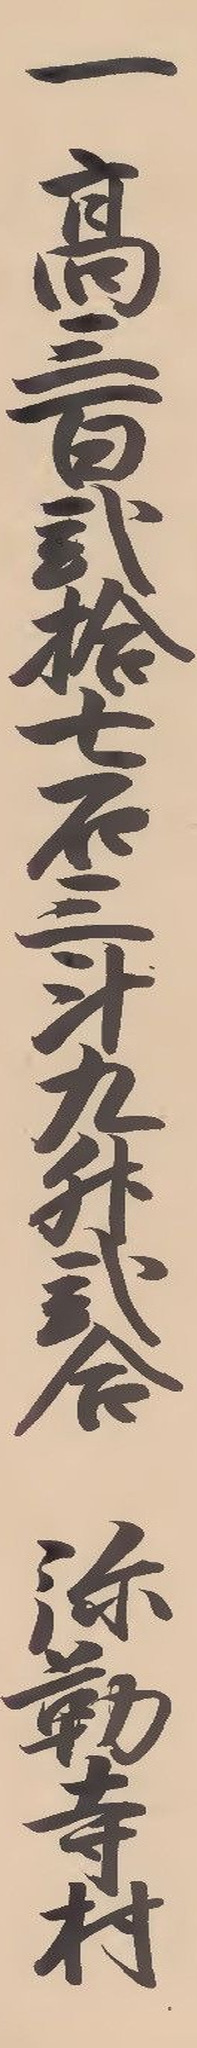一高三百弐拾七石三斗九升弐合弥勤寺村
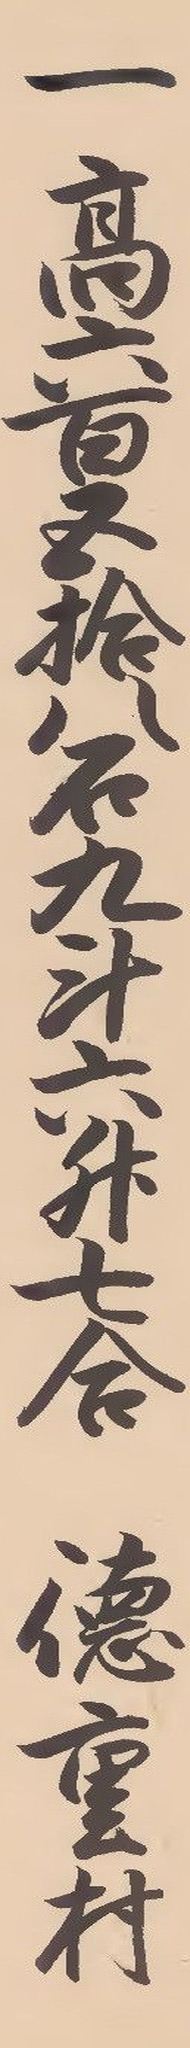一高六百五拾八石九斗六升七合徳重村
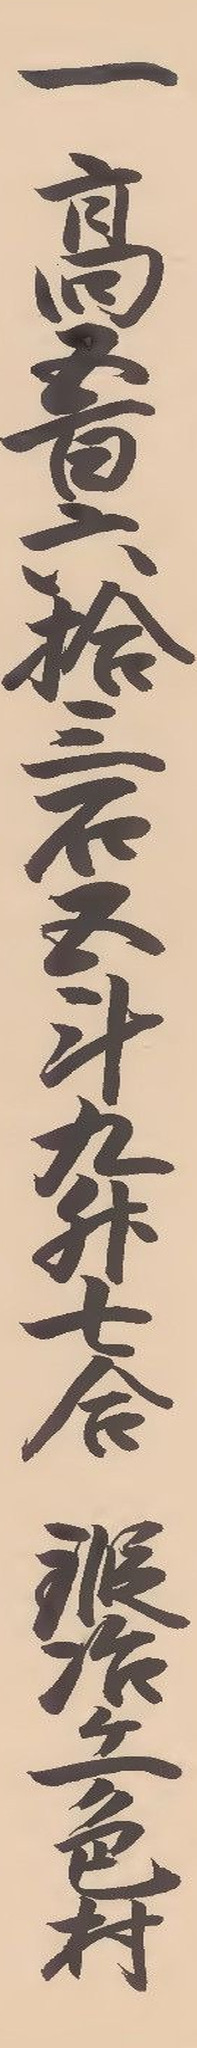一高五百六拾三石五斗九升七合鍛冶ヶ一色村
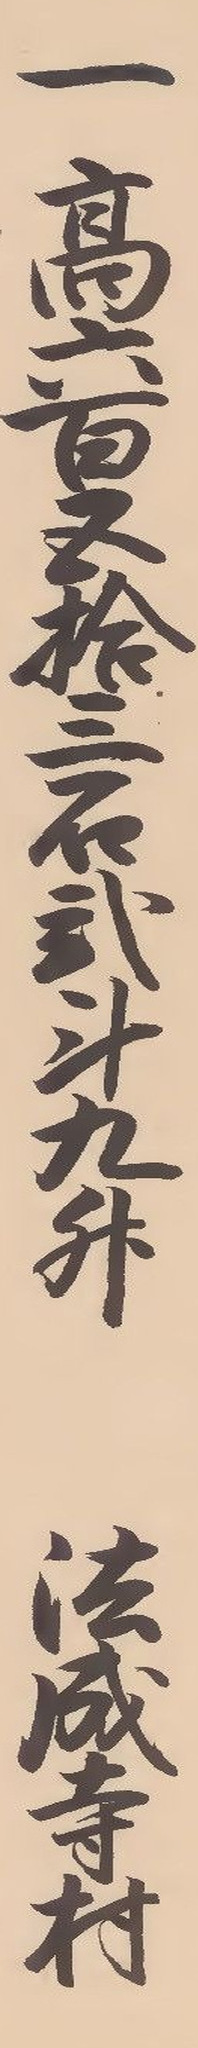一高六百五拾三石弐斗九升法成寺村
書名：尾張国郷帳
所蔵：国立公文書館 National Archives of Japan
